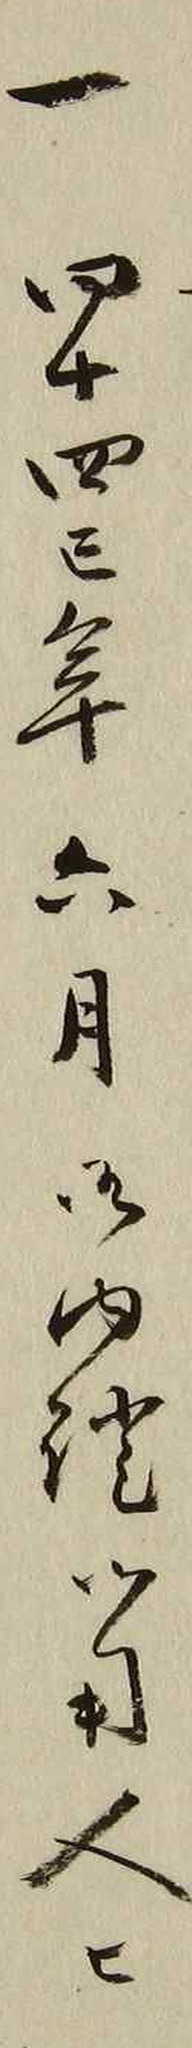一同十四巳年六月御内証御用人被
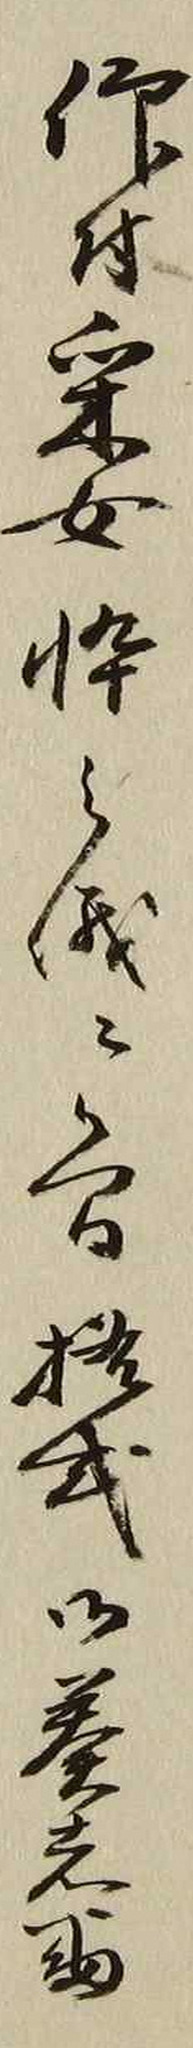仰付采女忰之儀に候間格式御奏者番
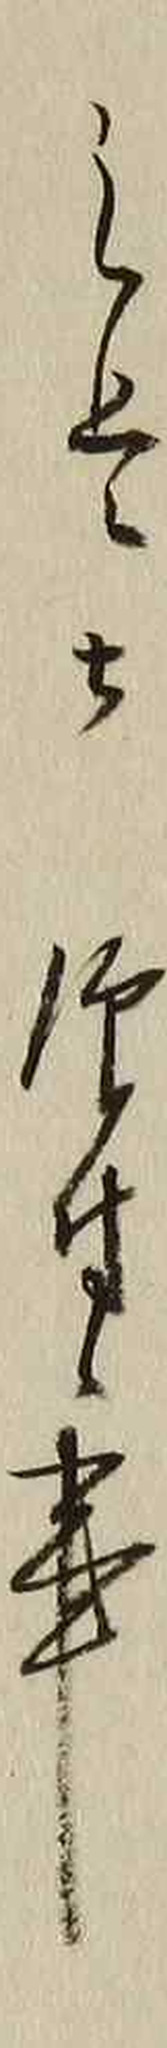之上に被仰付候事
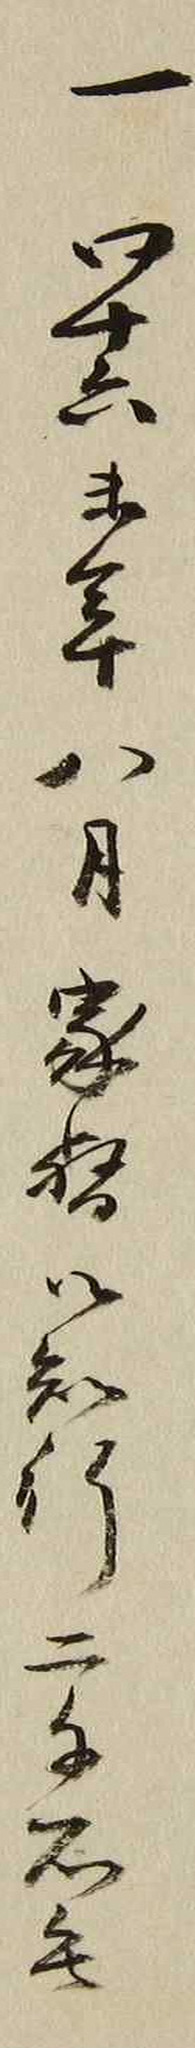一同十六未年八月家督御知行二千石無
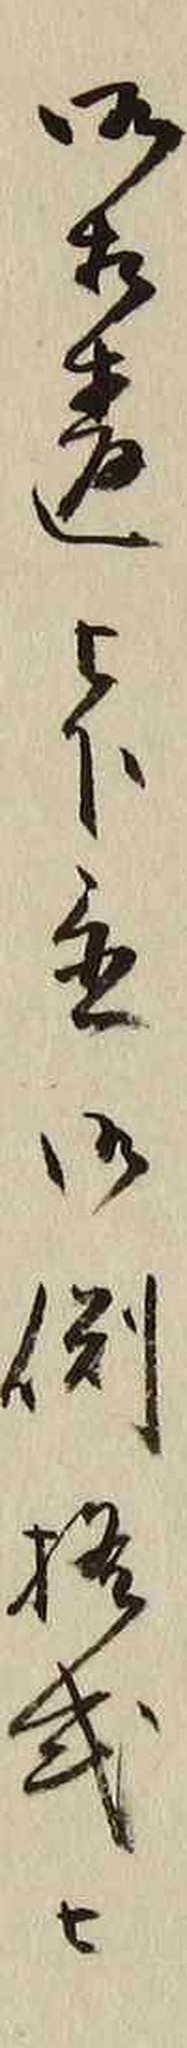御相違被下置御側格式被
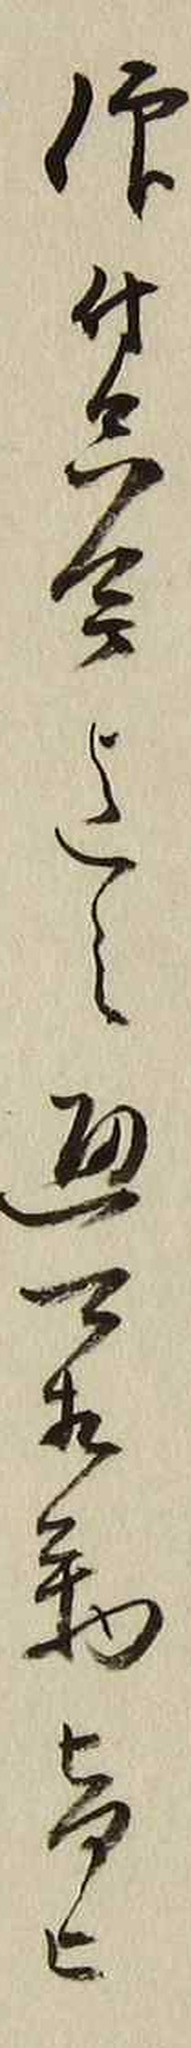仰付只今迄之通可相勤旨被
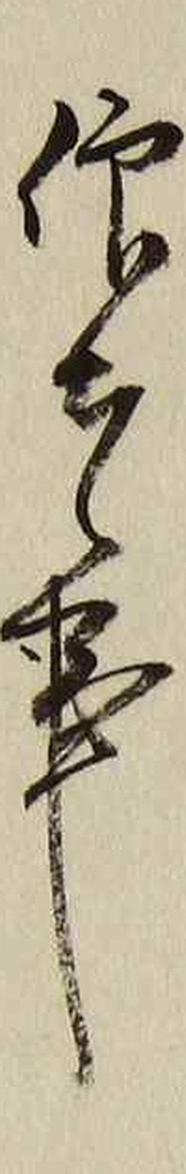仰出候事
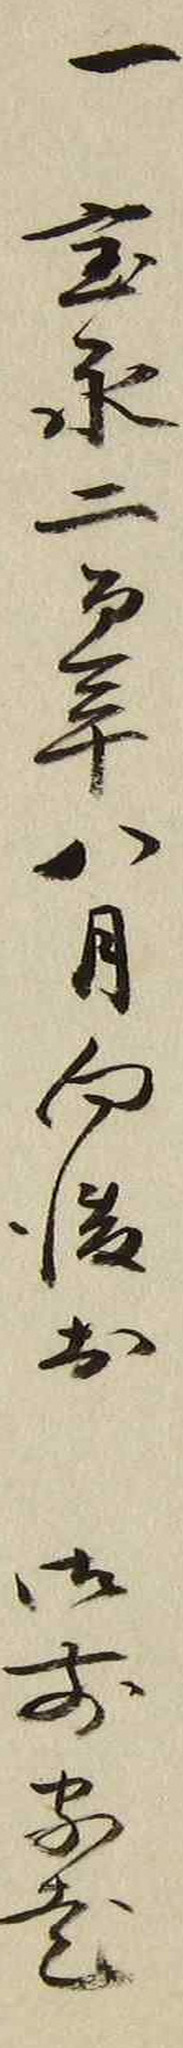一宝永二酉年八月向後於御前家老
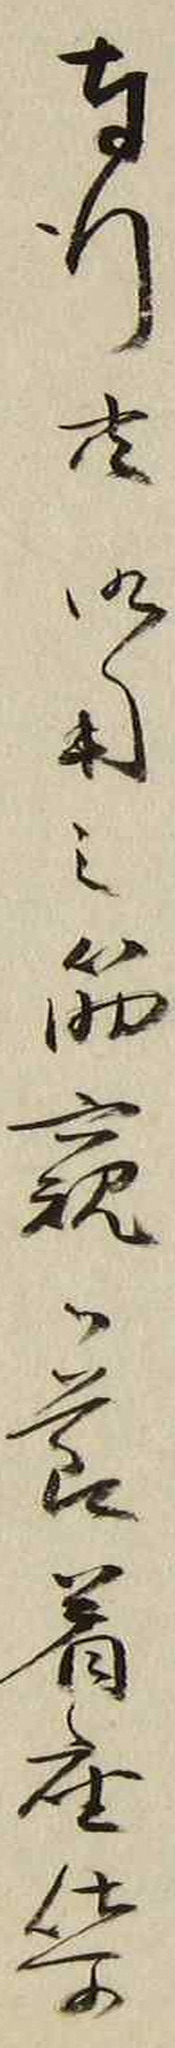奉行共御用之節窺候節着座仕相
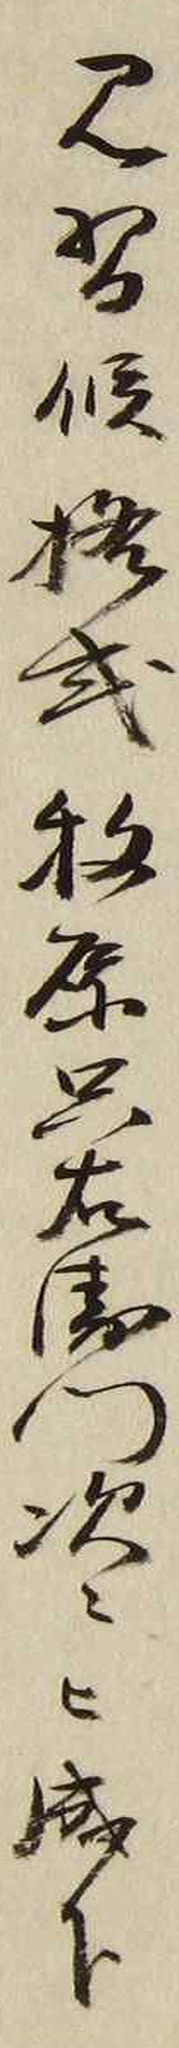見習候格式牧原只左衛門次に被成下

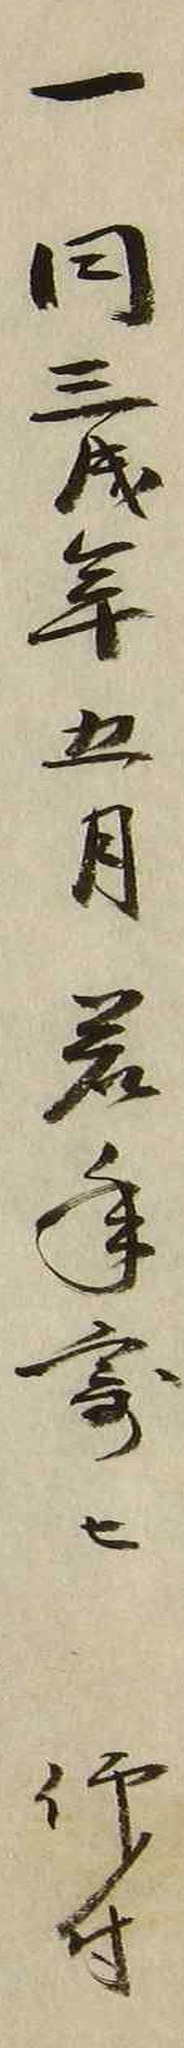一同三戌年五月若年寄被仰付
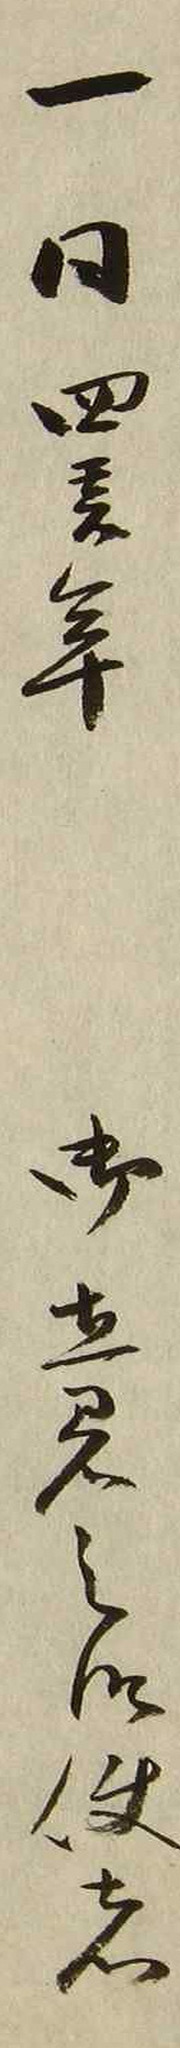一同四亥年御在着之御使者
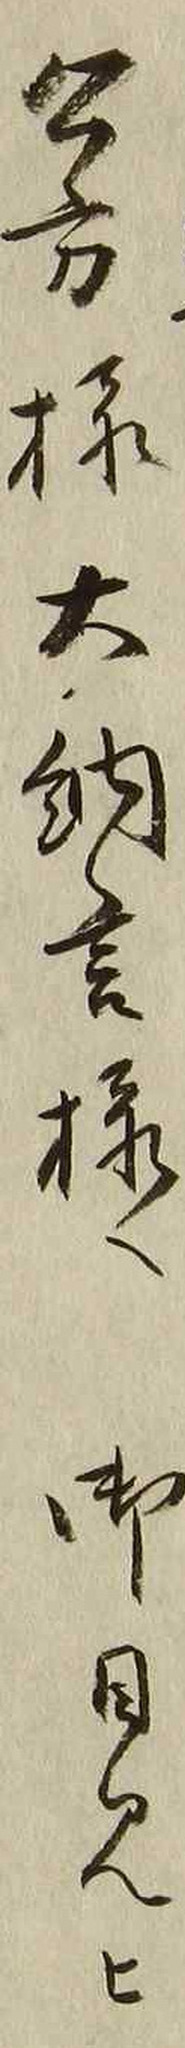公方様大納言様へ御目見被
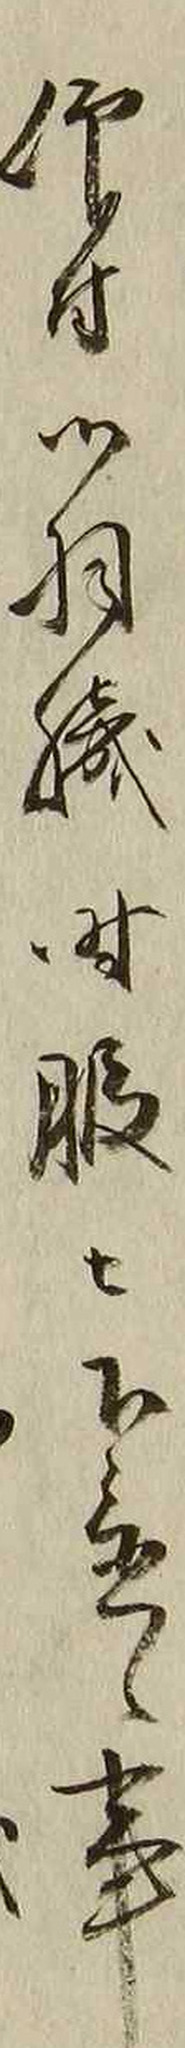仰付御羽織時服被下置候事
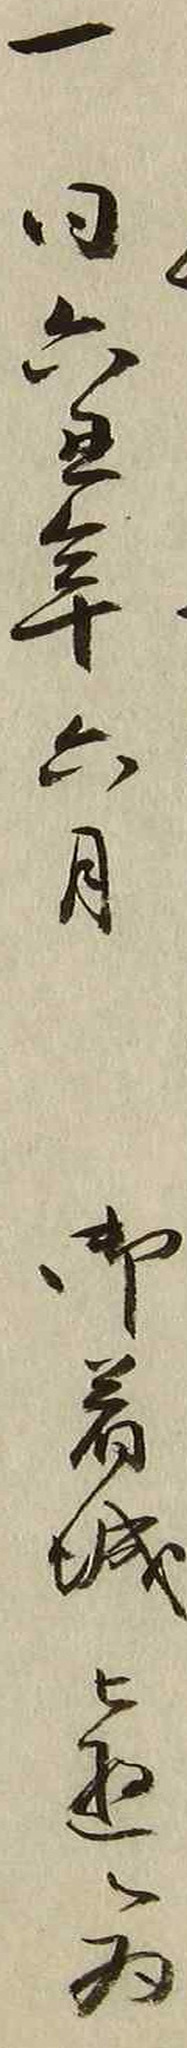一同六丑年六月御着城被遊候為
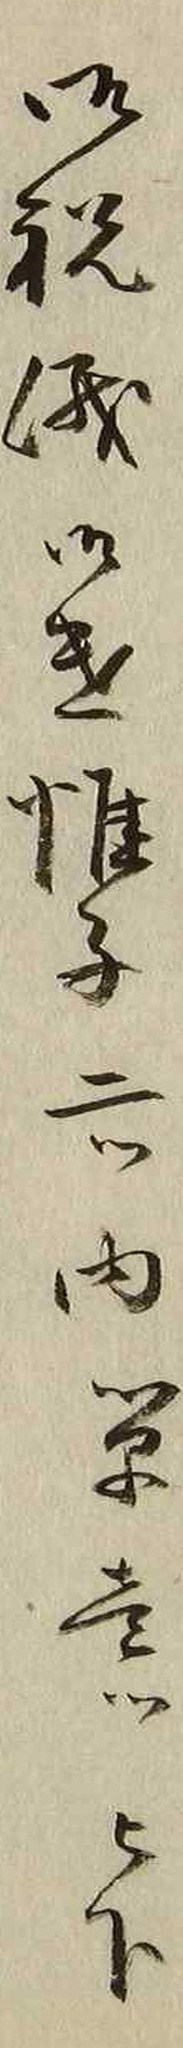御祝儀御継帷子二つ内単壱つ被下
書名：諸士系譜　巻之292　き之部1
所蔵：会津若松市立会津図書館
